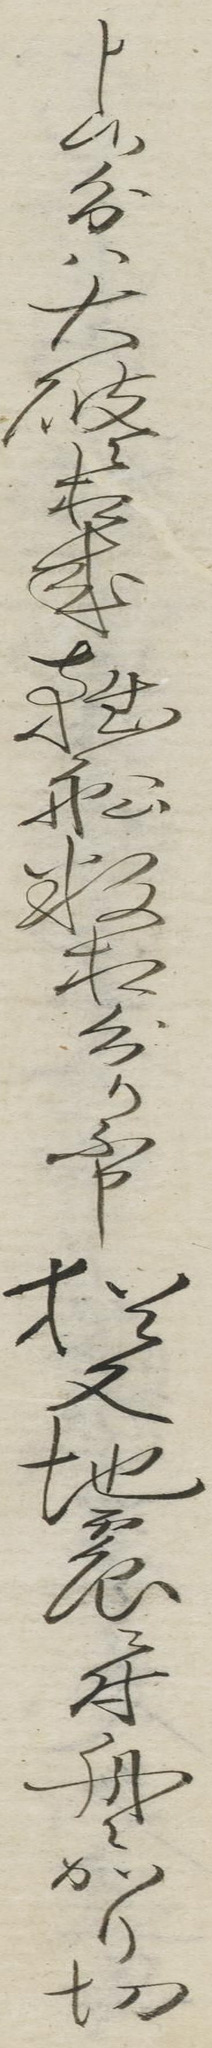申候分ハ大破ニ相成難船数相分り不申猶又地震ニ付舟〻かり切
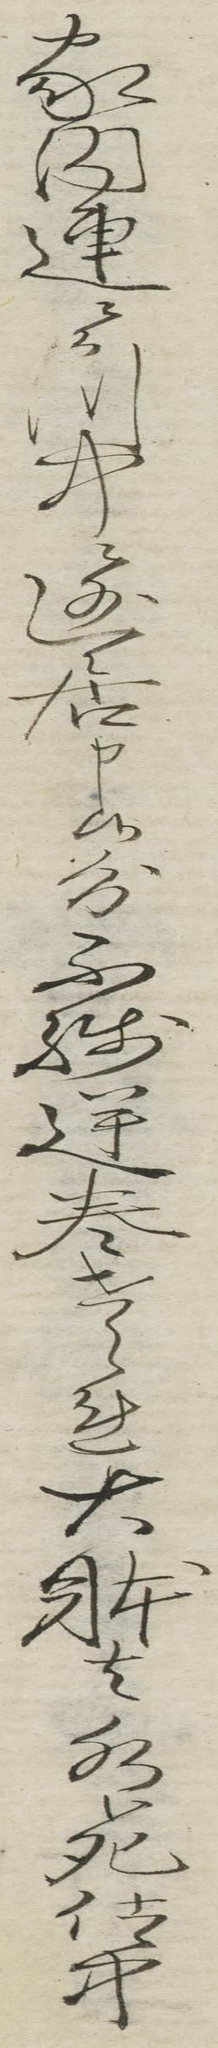家内連ニ而川中ニ逃居申候分不残逆巻せられ大体は水死仕候中
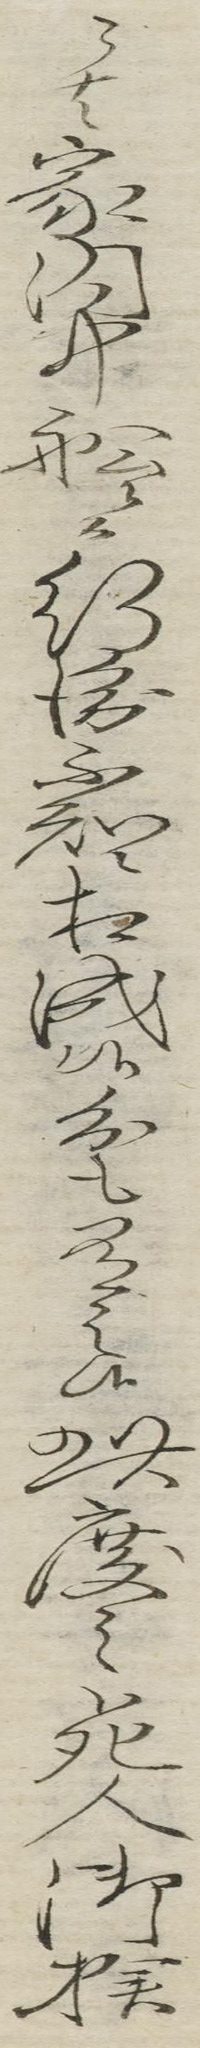ニは家内中船ニ而行衛不知ニ相成候分も有之候此度之死人御検

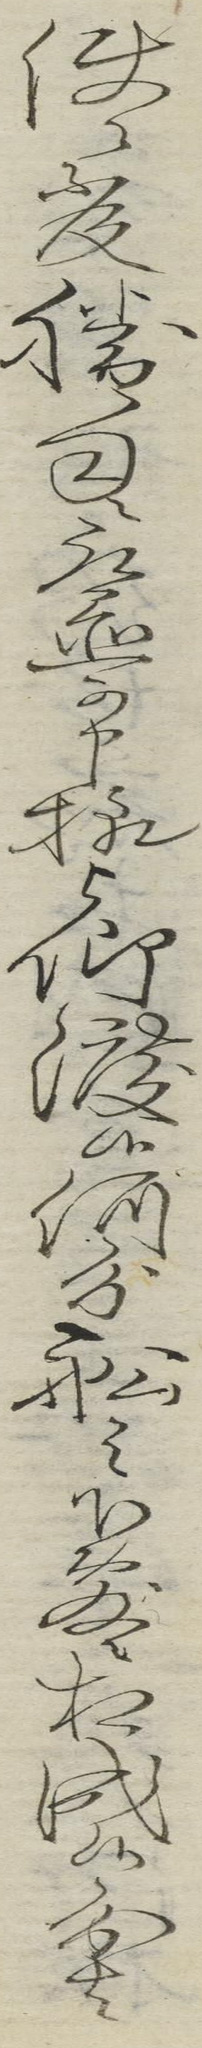使ニ不及勝手ニ取置可申様被仰渡候何分船之下敷ニ相成候分は
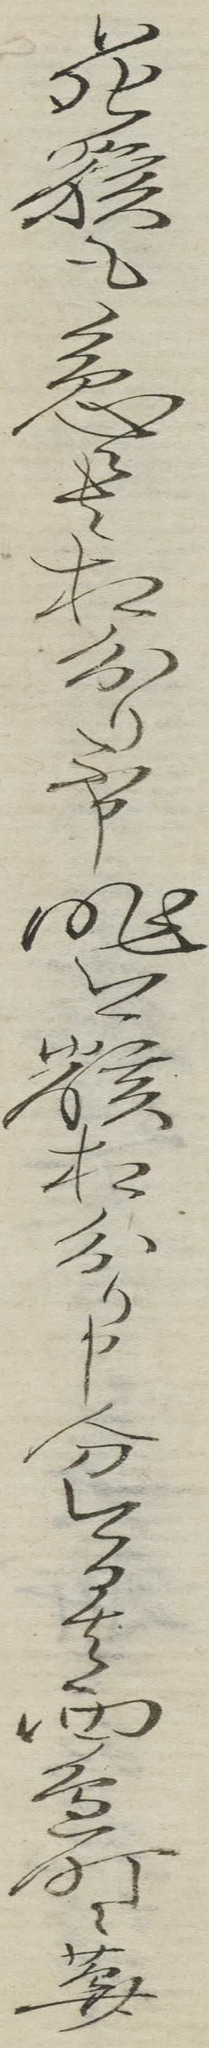死骸も急ニは相分り不申昨日骸相分り申分今日は西辺町〻葬
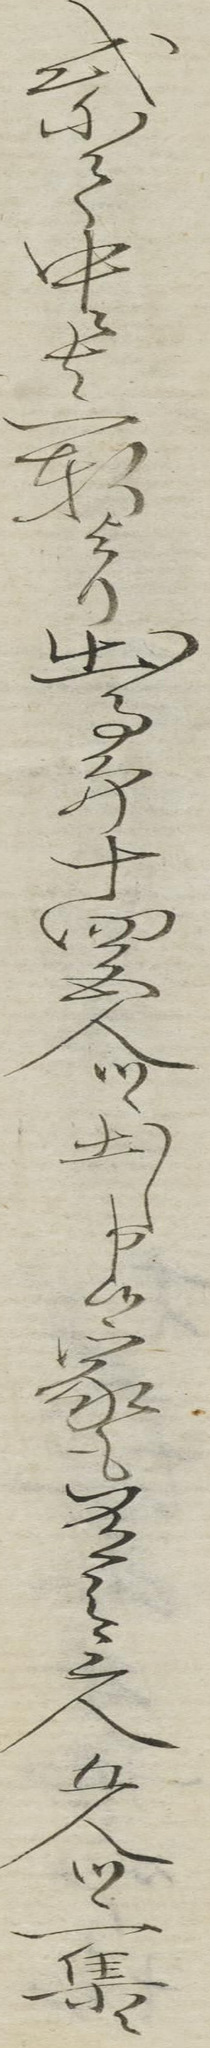式にて中ニは一軒より出る事十四五人ツヽ出し申候家も有之三人五人ツヽ一集ニ
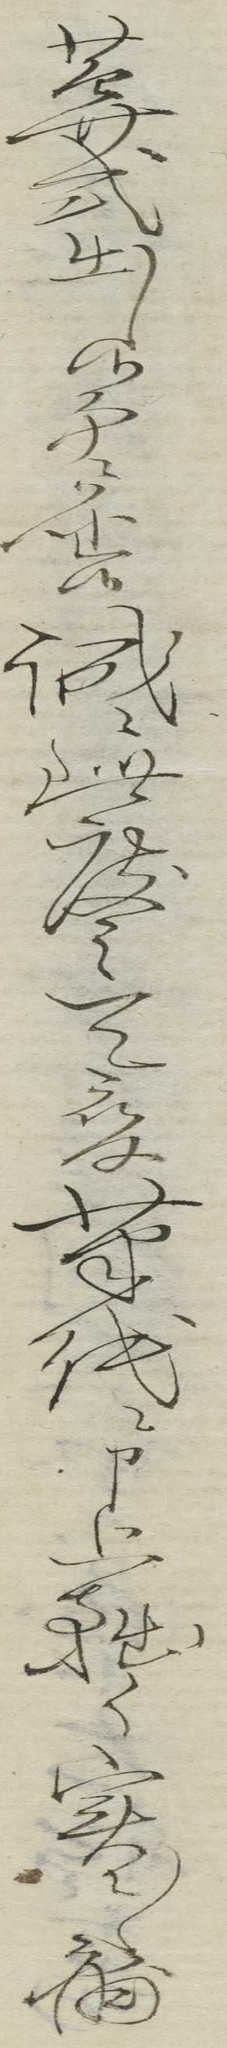葬式出し候事ニ御座候誠ニ此度之天変筆紙ニ申上難く実ニ〳〵痛
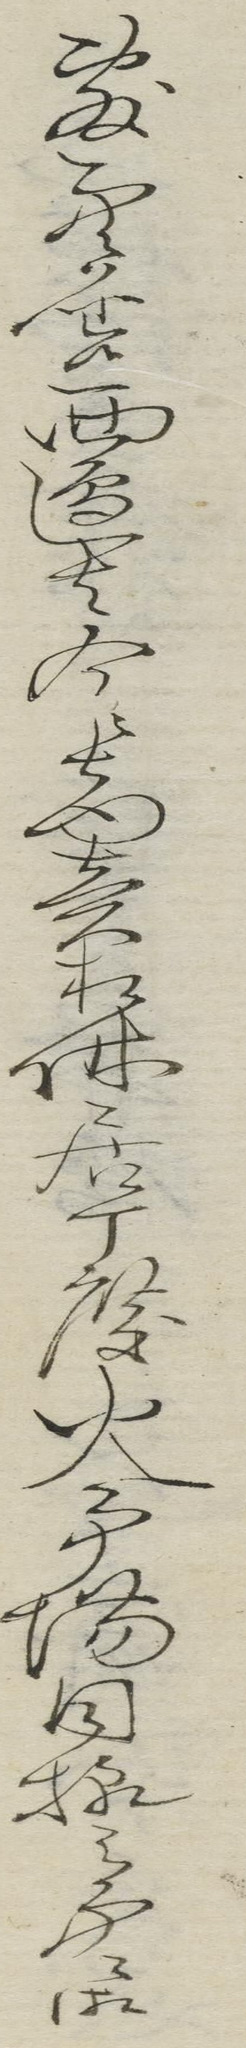敷事ニ御座候西辺は今ニ商売相休居丁度火事場同様之事ニ御
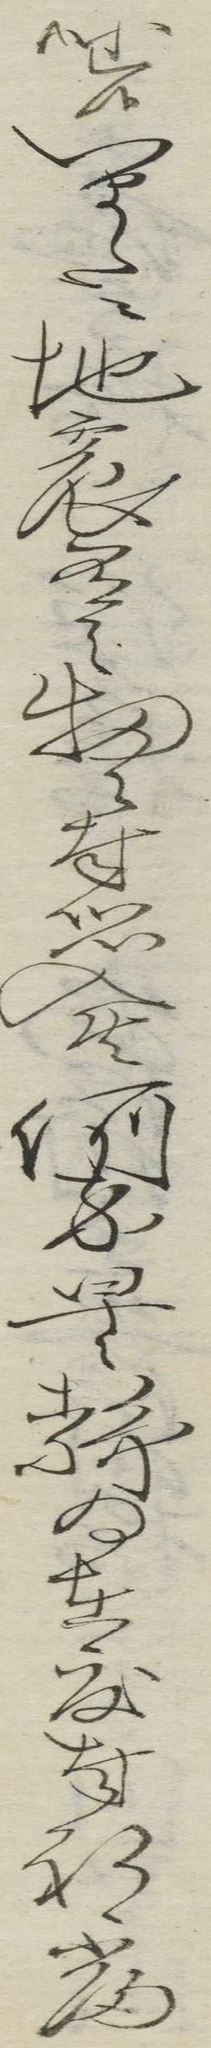座候いまたニ地震有之物ニ付恐入候何卒早〻静ゐ在度奉祈候當
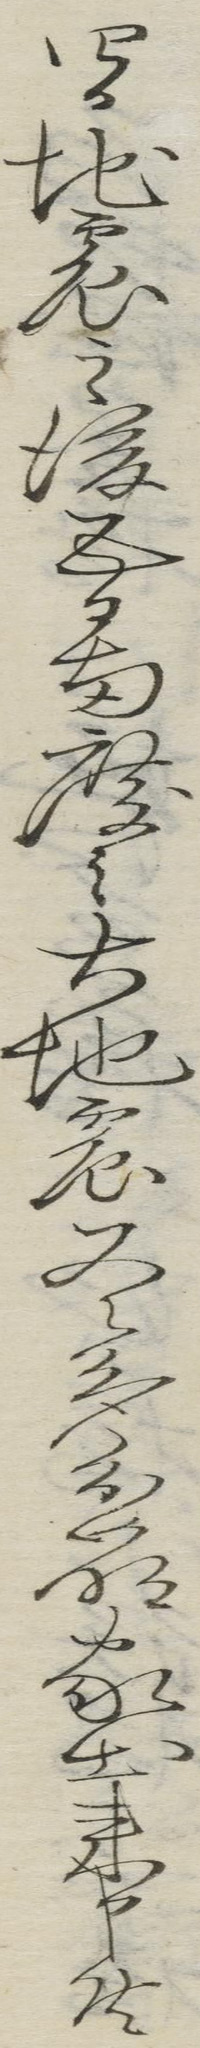四日地震之後五日両度之大地震又〻多分崩家出来申候
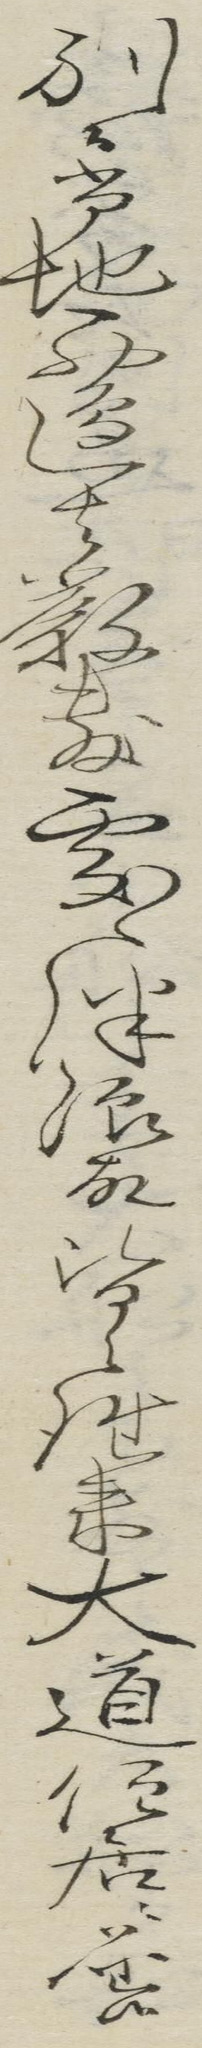別而当地西辺は厳敷処津浪故皆〻誰来大道住居ニ御座候
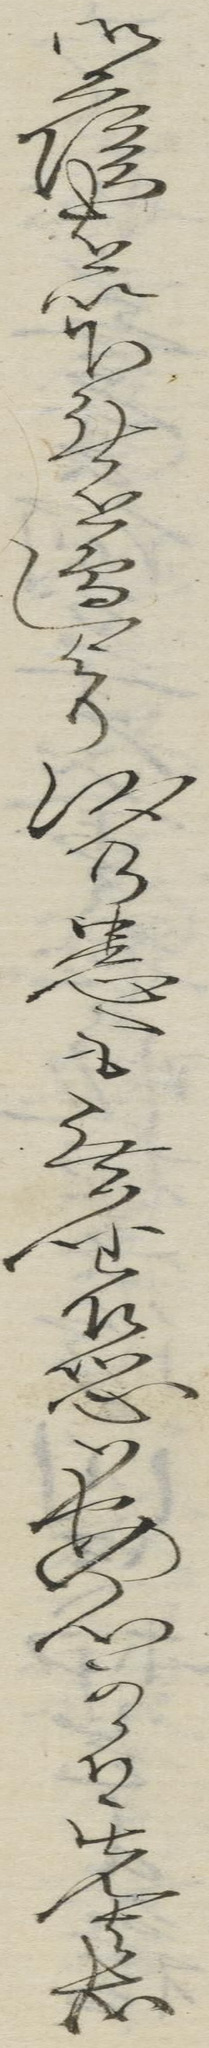御蔭を以て下候近辺より汐の患へも無御座乍恐御安心可被下候先は右
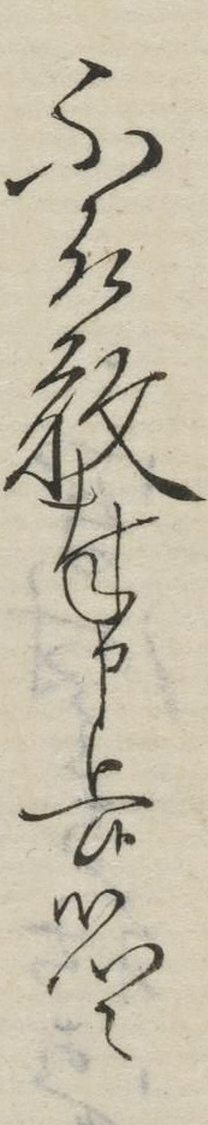不取敢奉申上候恐々
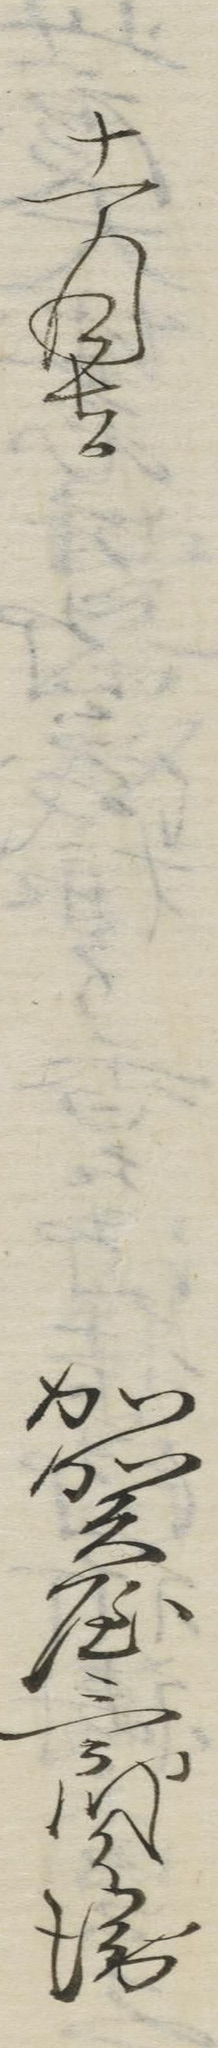十一月七日加賀屋三郎兵衛
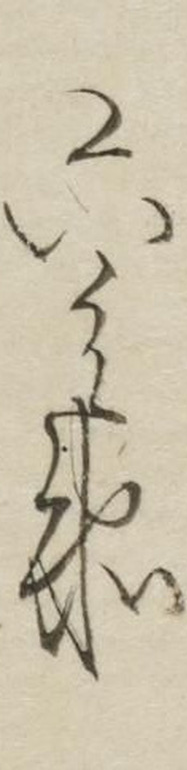六兵衛
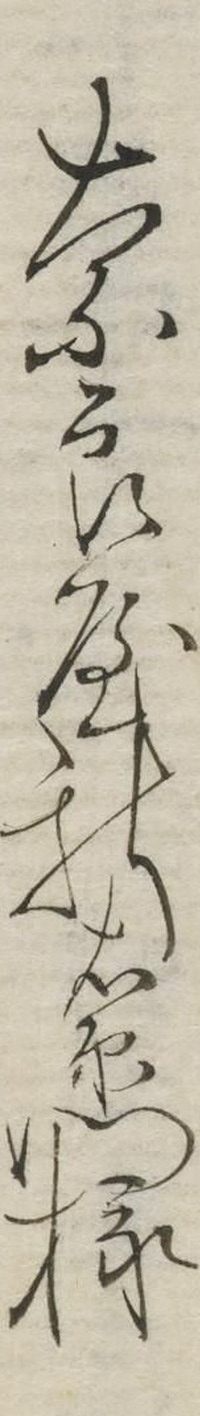奈良屋新右衛門様
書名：大地震實録
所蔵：東京大学地震研究所図書室 Earthquake Research Institute Library, The University of Tokyo, JAPAN
